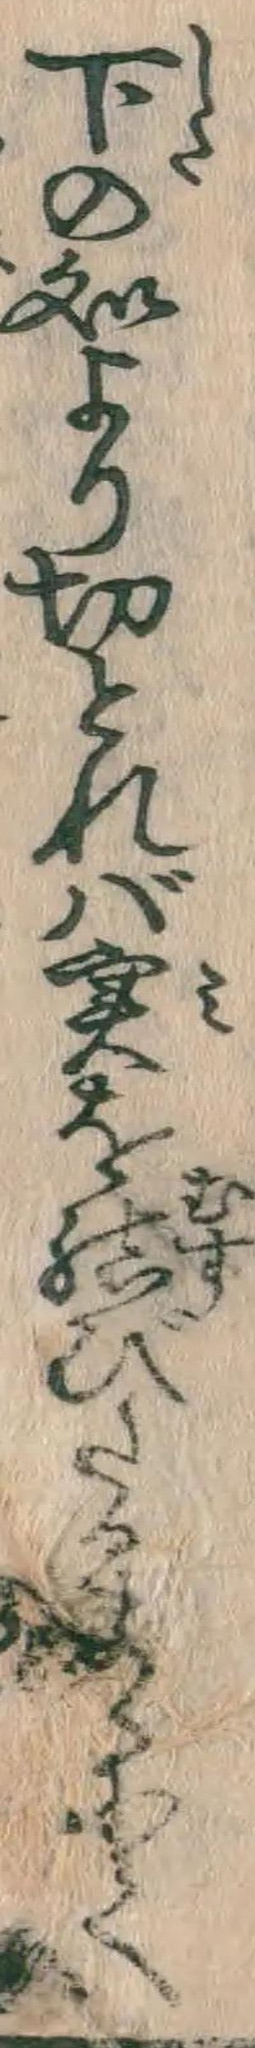下の処より切とれば実を結びたるまゝにて
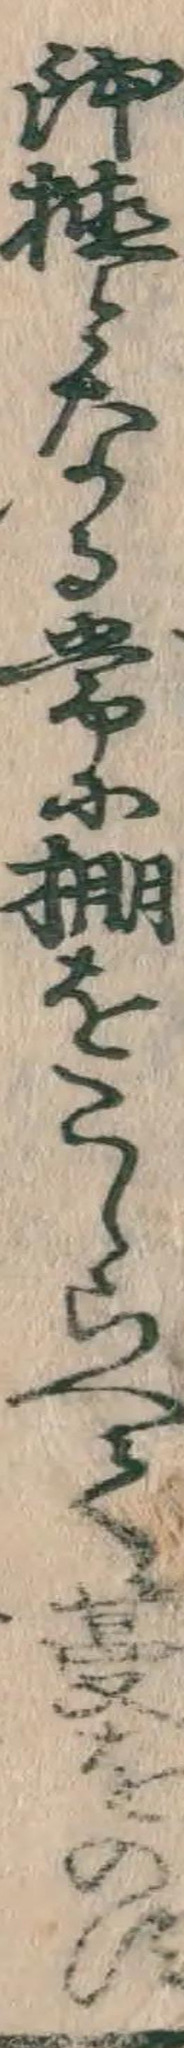鉢植となる常に棚をこしらへて蔓をのす
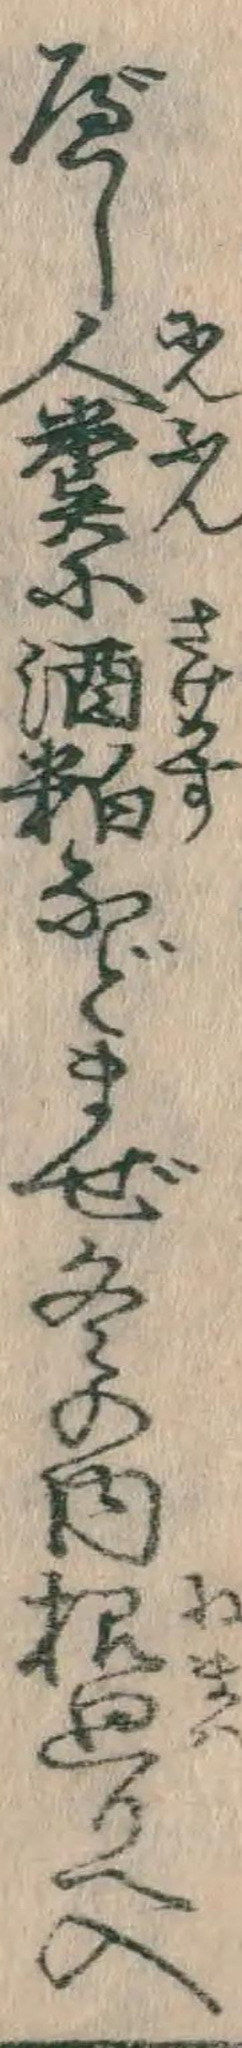べし人糞に酒粕などまぜ冬の内根廻りへ入
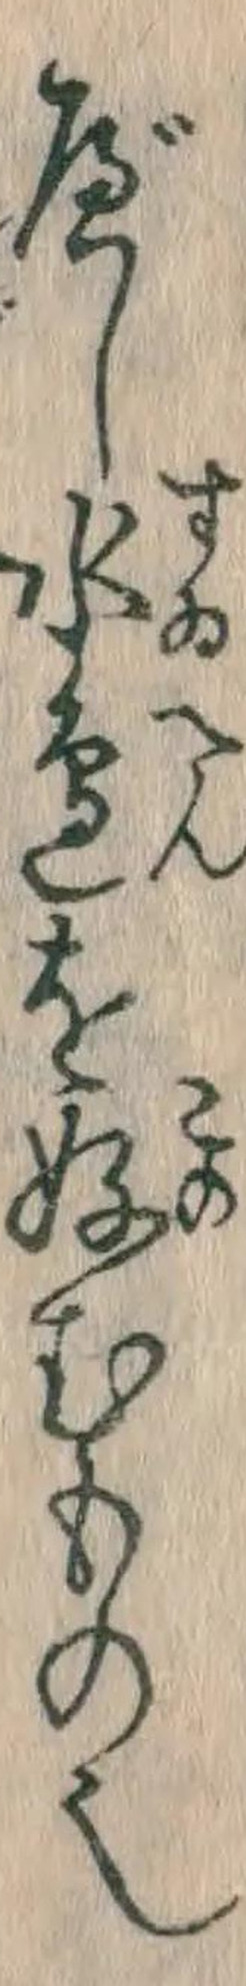べし水辺を好むもの也
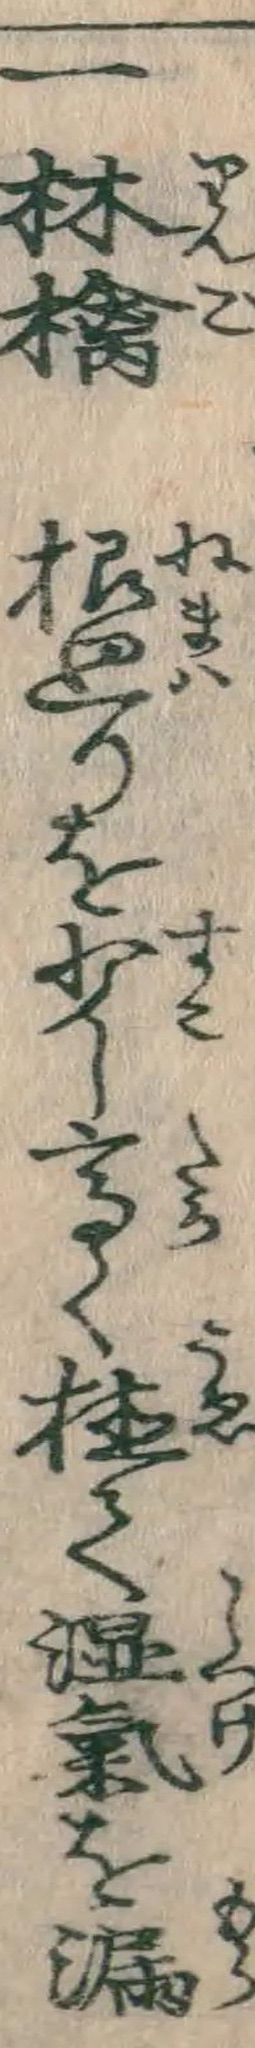一林檎根廻りを少し高く植て湿気を漏
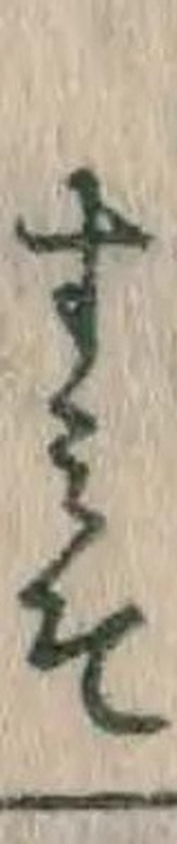すみそ
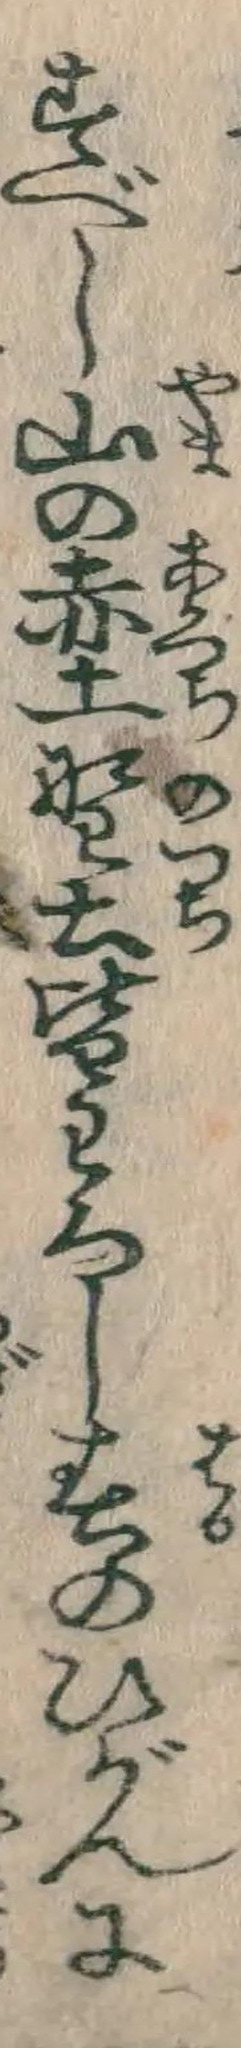すべし山の赤土野土皆わろし春のひがんに
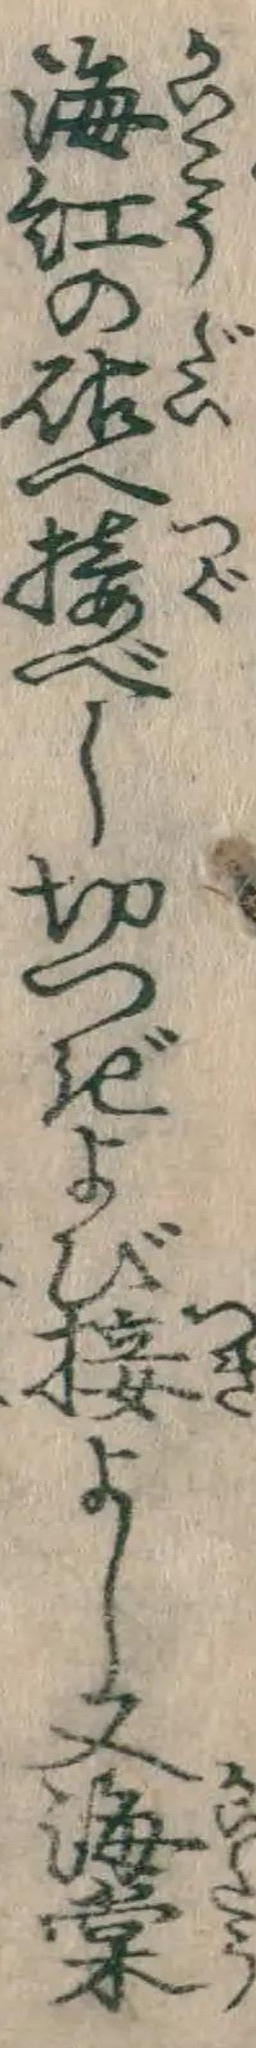海紅の砧へ接べし切つぎよび接よし又海棠
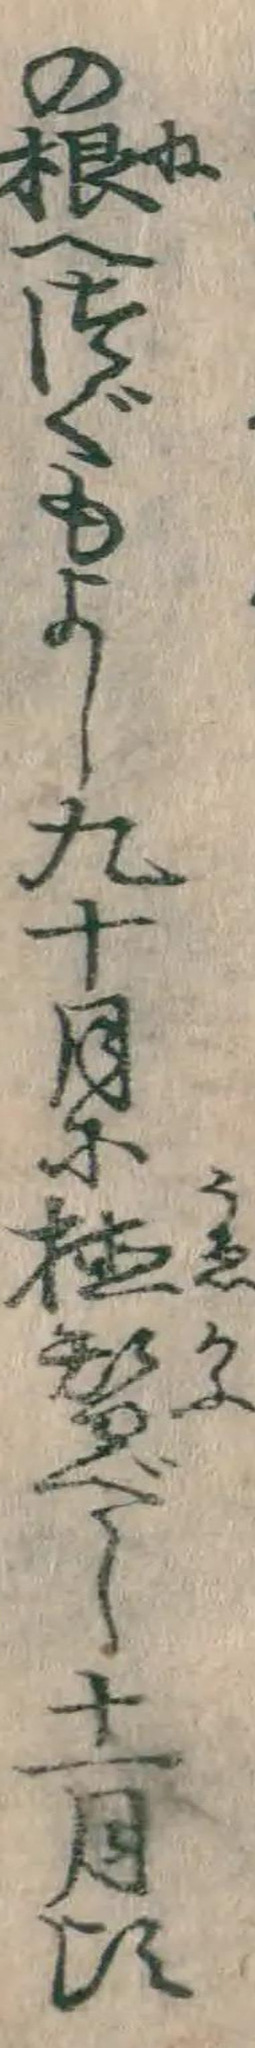の根へつぐもよし九十月に植替べし十一月頃
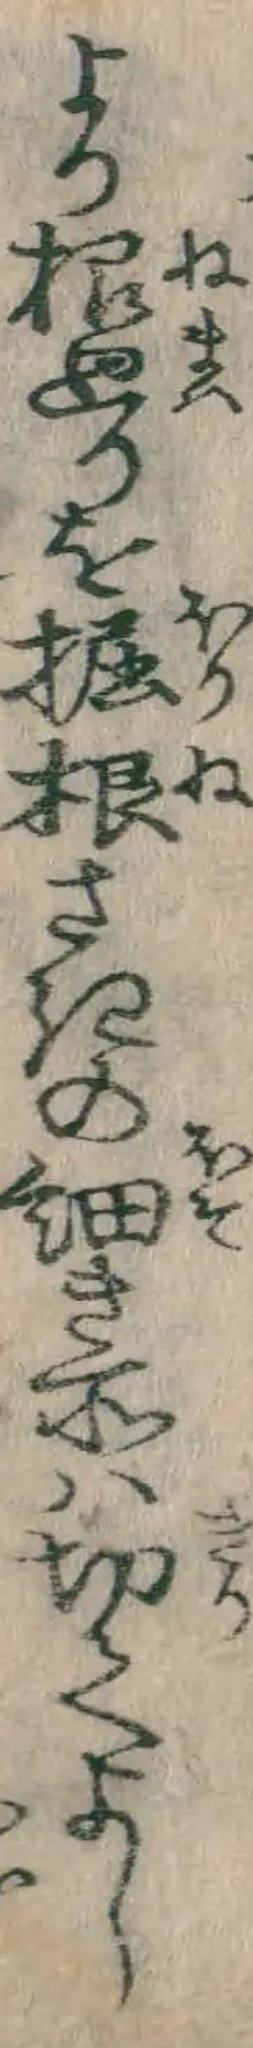より根廻りを掘根さきの細き所は切てよし
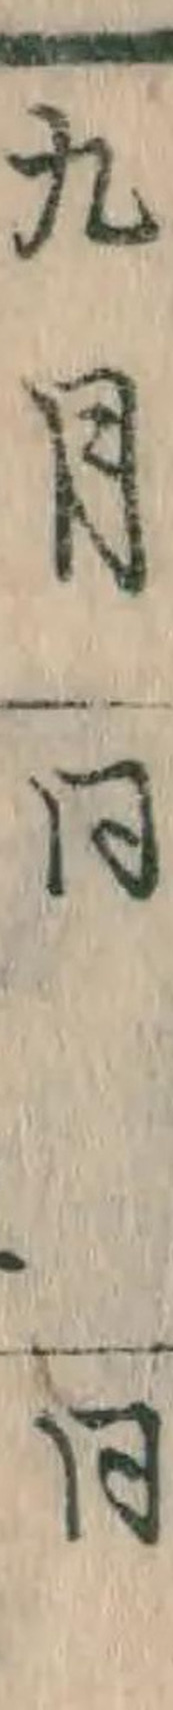九月同同
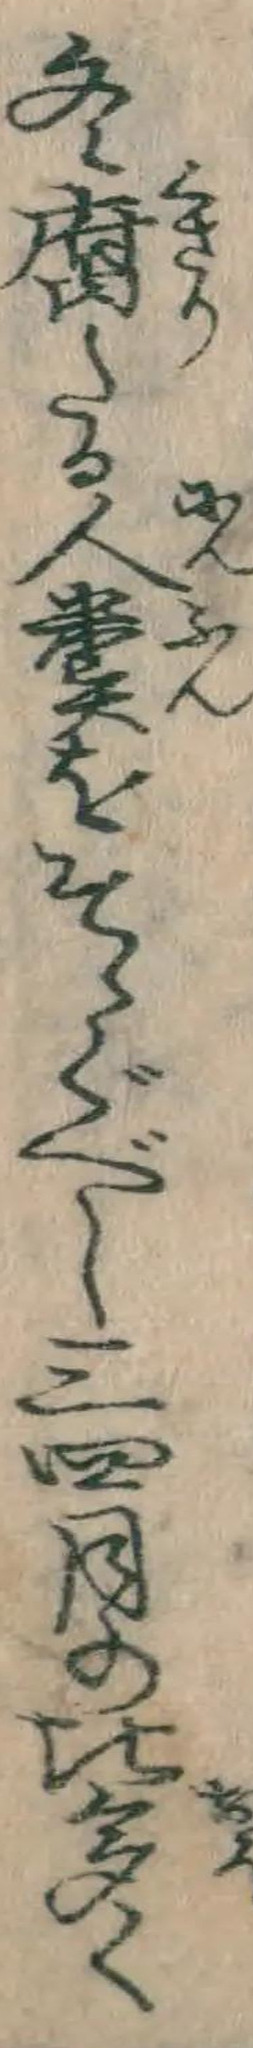冬腐たる人糞をそゝぐべし三四月の比多く
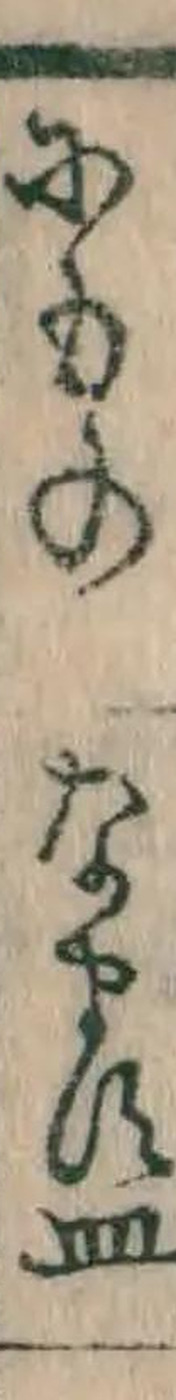にものなます皿汁
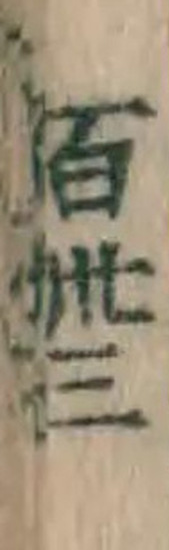百卅三

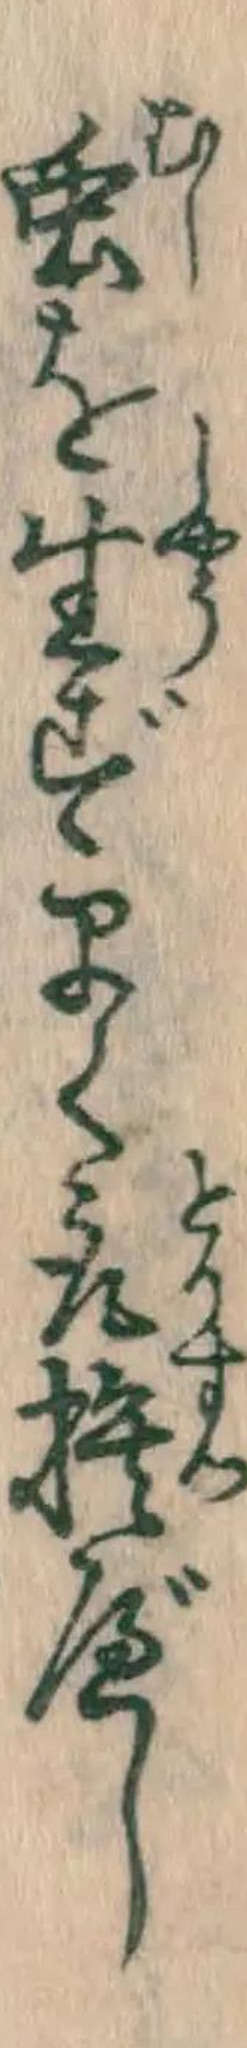虫を生ず早く取捨べし
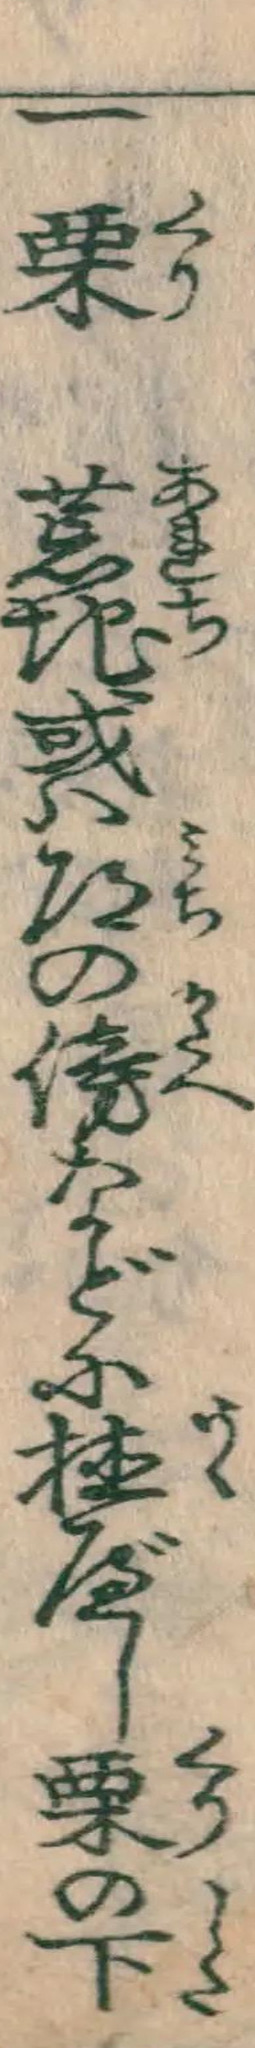一栗荒地或は道の傍などに植べし栗の下
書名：広益秘事大全 3巻. [5]
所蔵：国立国会図書館 National Diet Library, JAPAN
